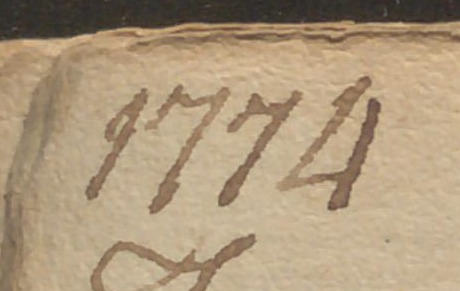1774
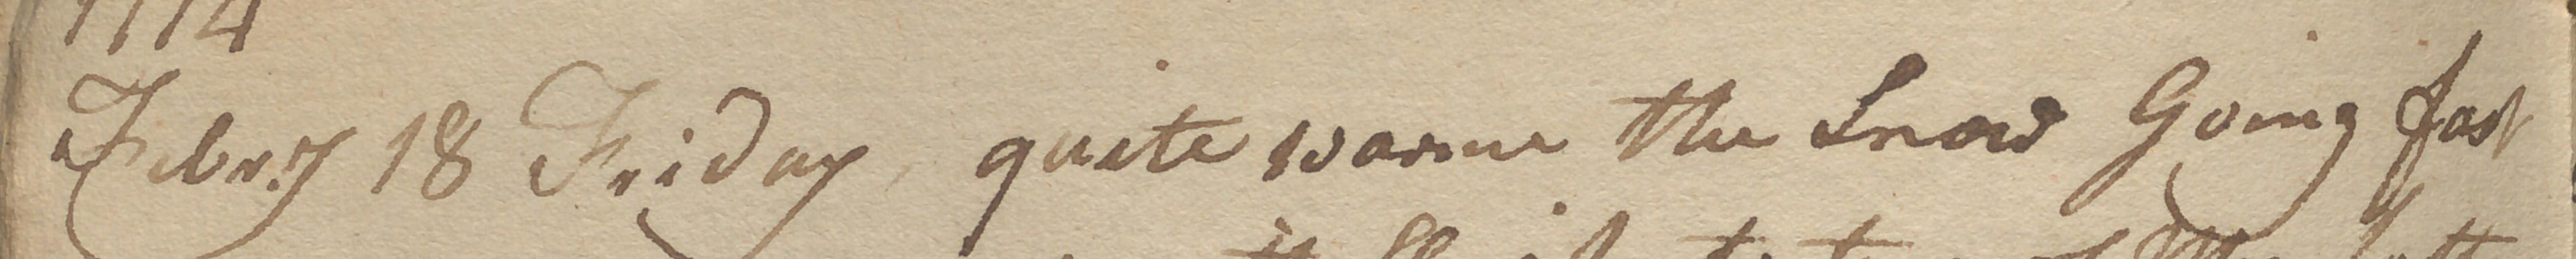Febry 18 Friday quite warme the Snow Going fast
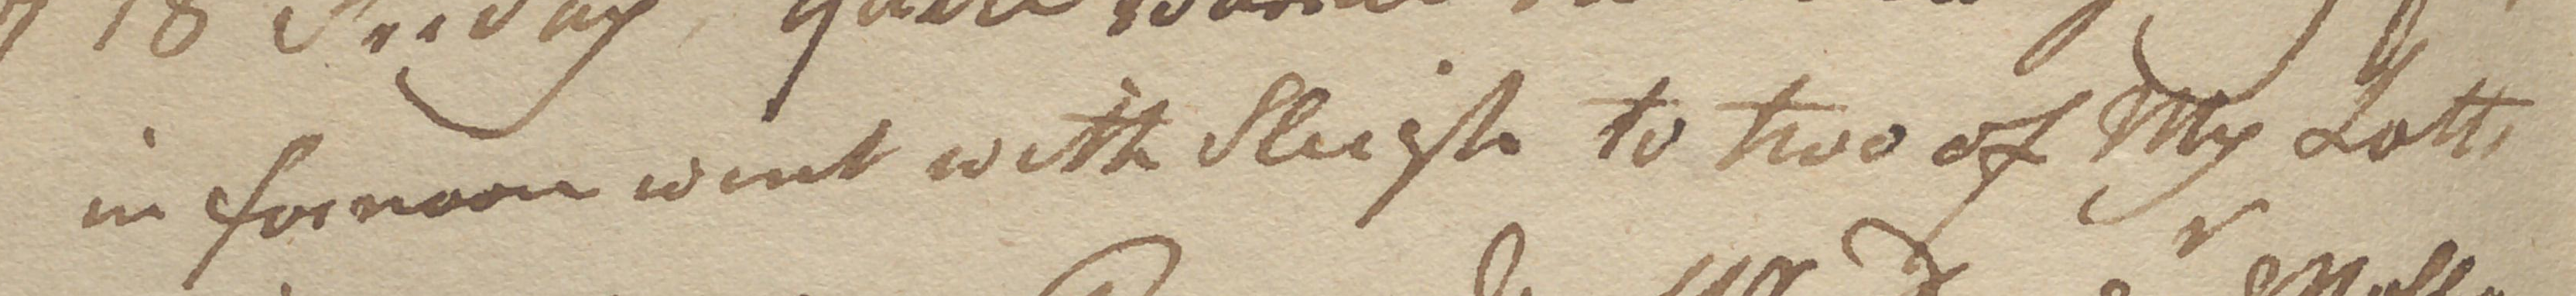in fornoon went with Sleigh to two of My Lotts
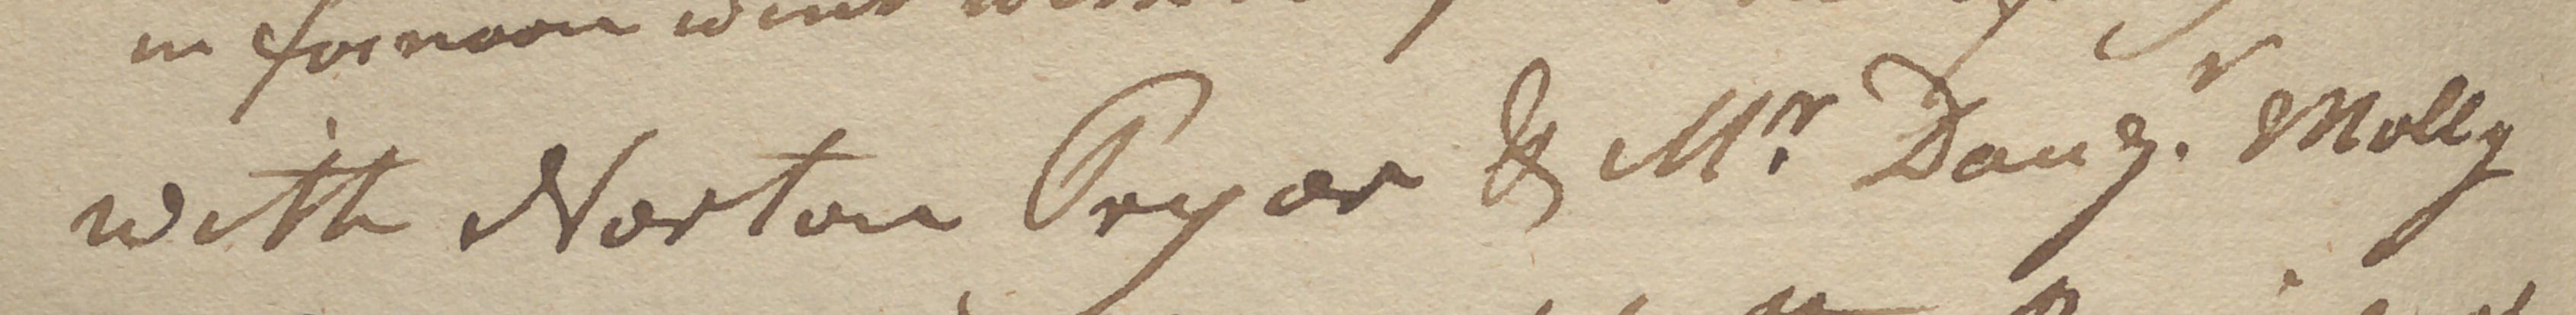with Norton Pryor & M^r. Daug^r. Molly
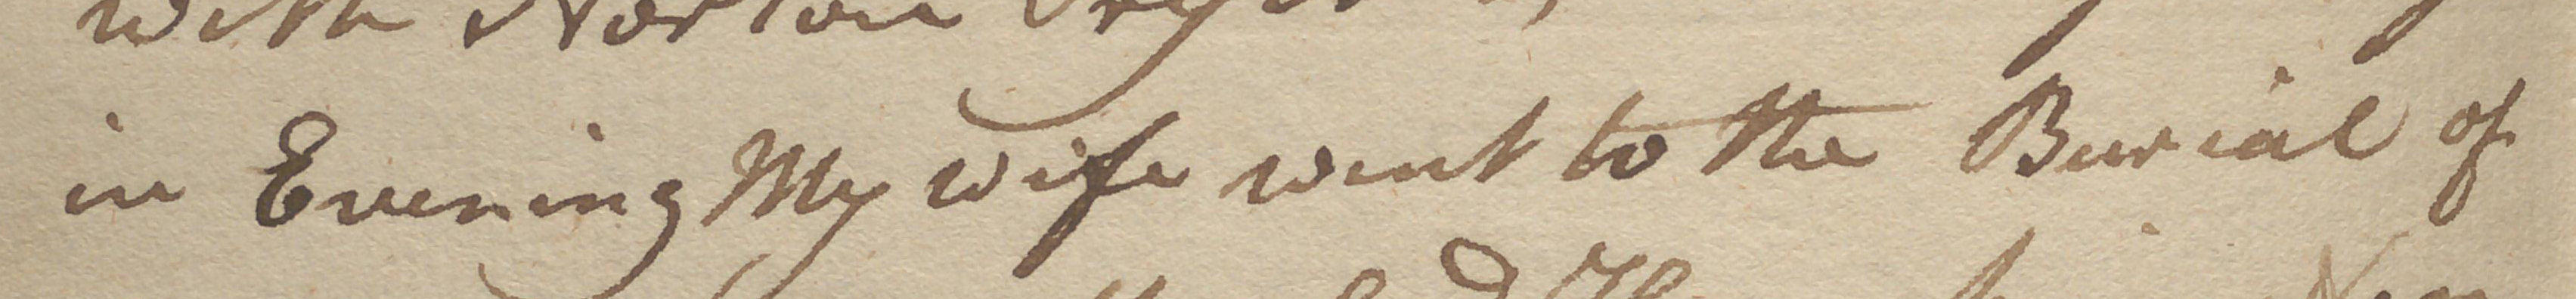in Evening My wife went to the Burial of
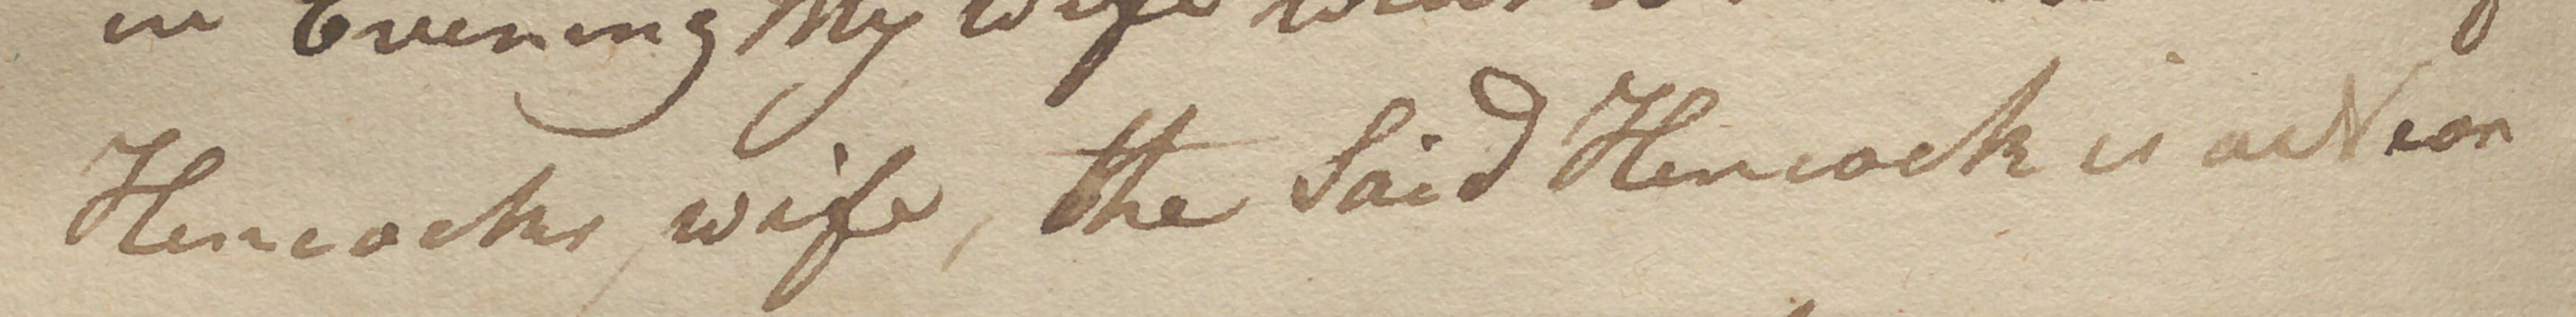Hincocks wife, the Said Hincock is a Near
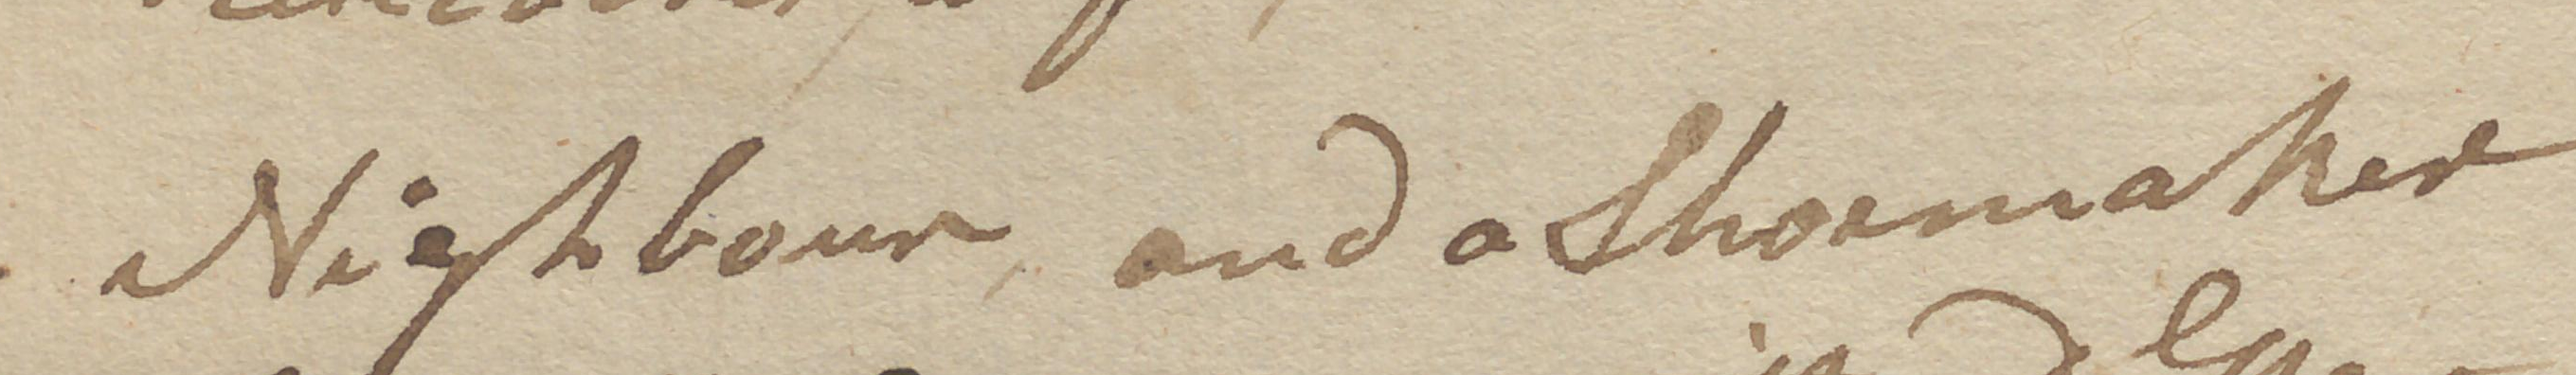Nighbour, and a Shoemaker
